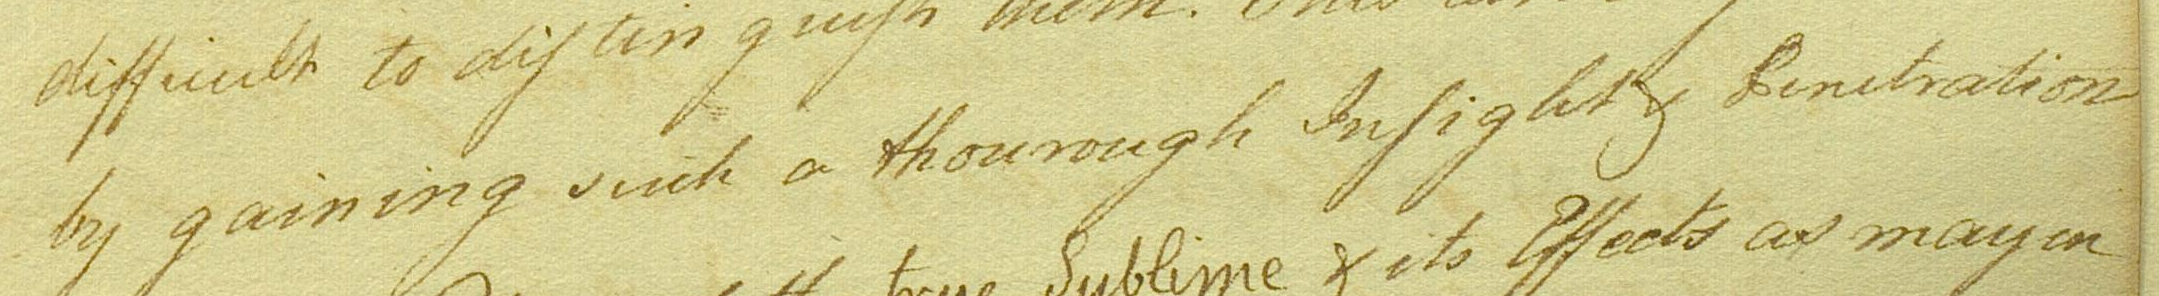by gaining such a thorough Insight & Penetration
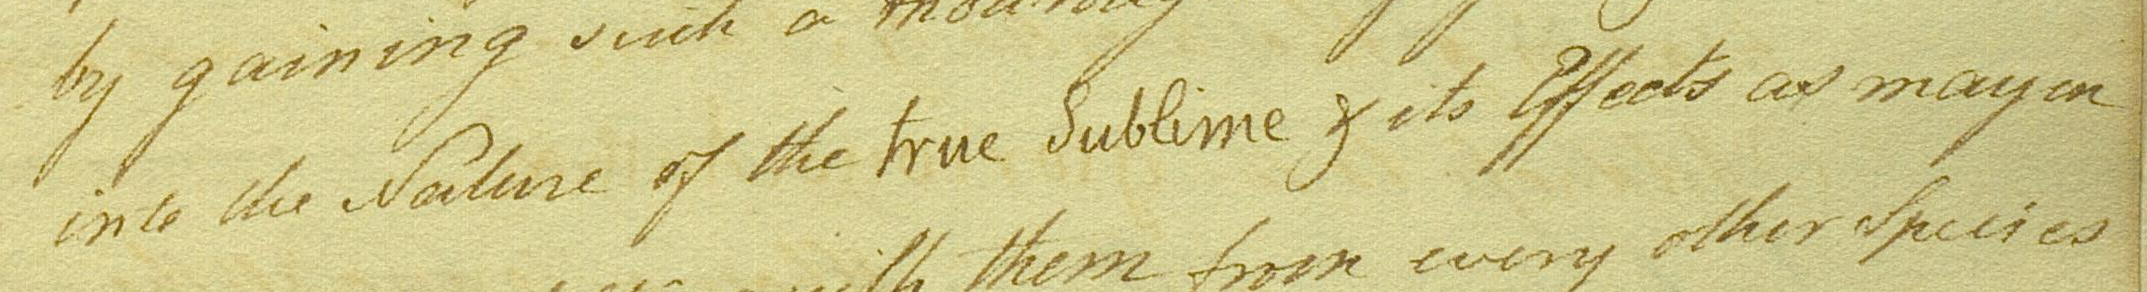into the Nature of the true Sublime & into Effects as may en
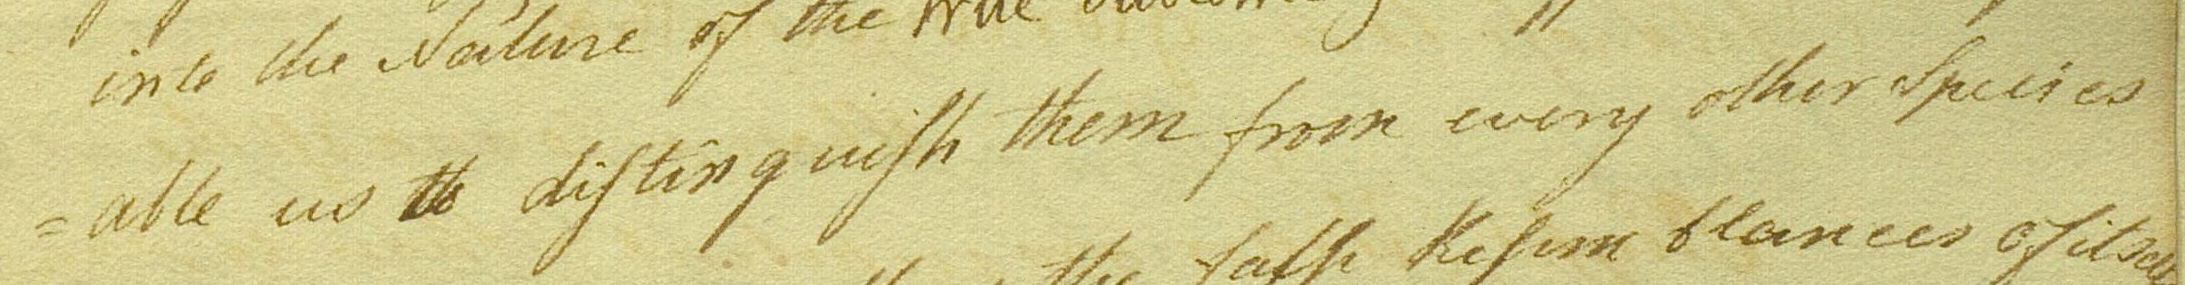-able us to distinguish them from every other Species
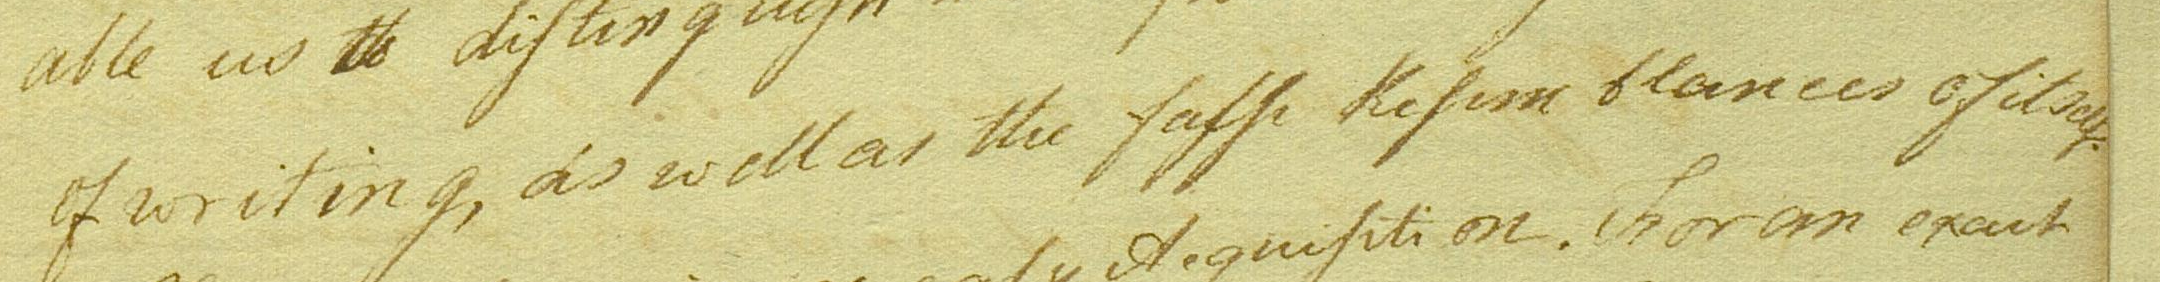of writing, as well as the false Resemblances of itself.
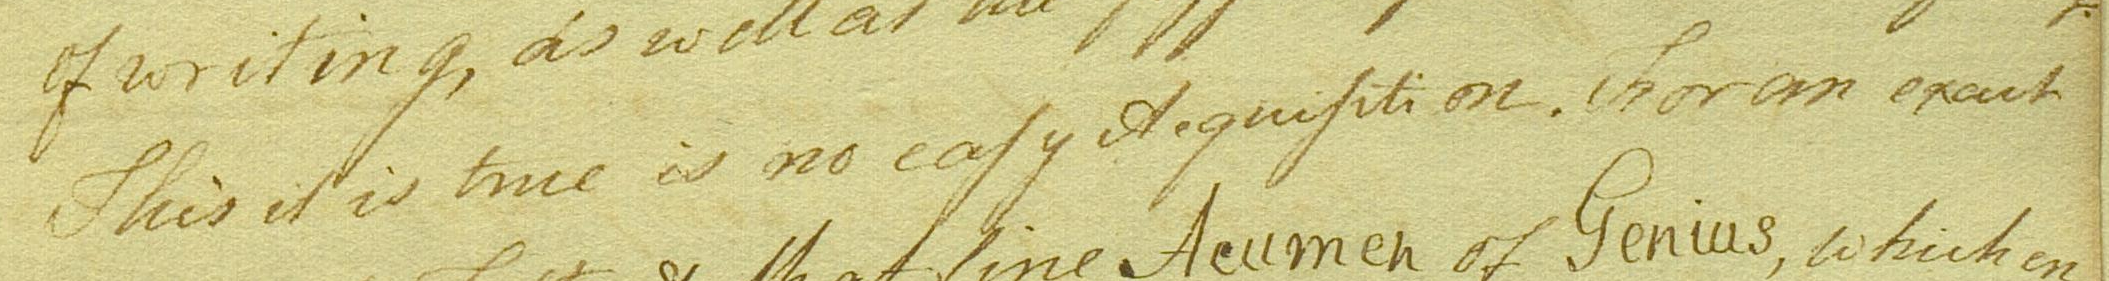This it is true is no easy Acquisition. For an exact
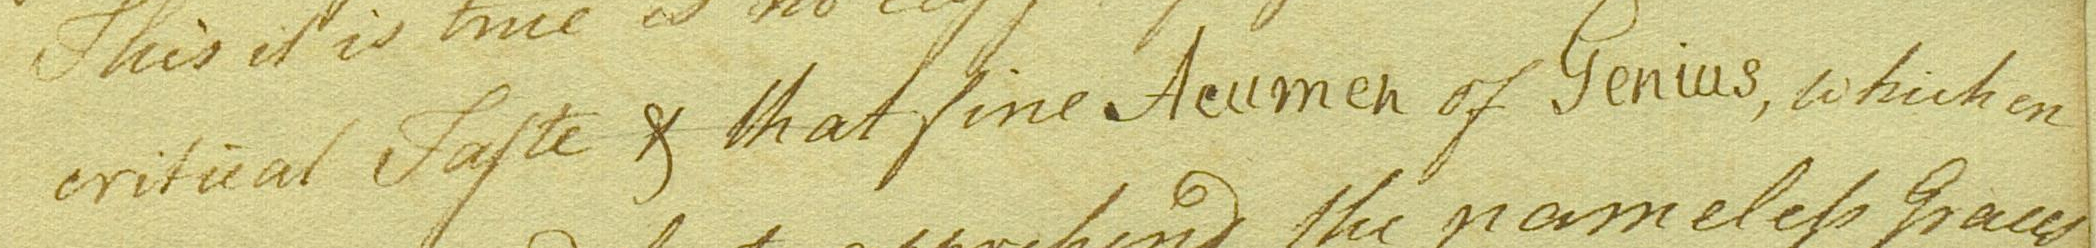critical Taste & that fine Acumen of Genius, which en
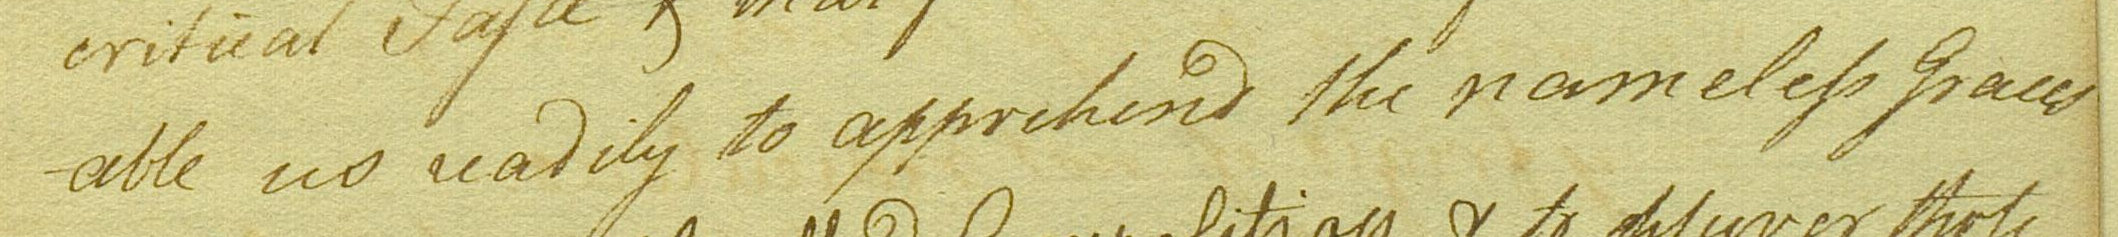-able us readily to apprehend the nameless Graces
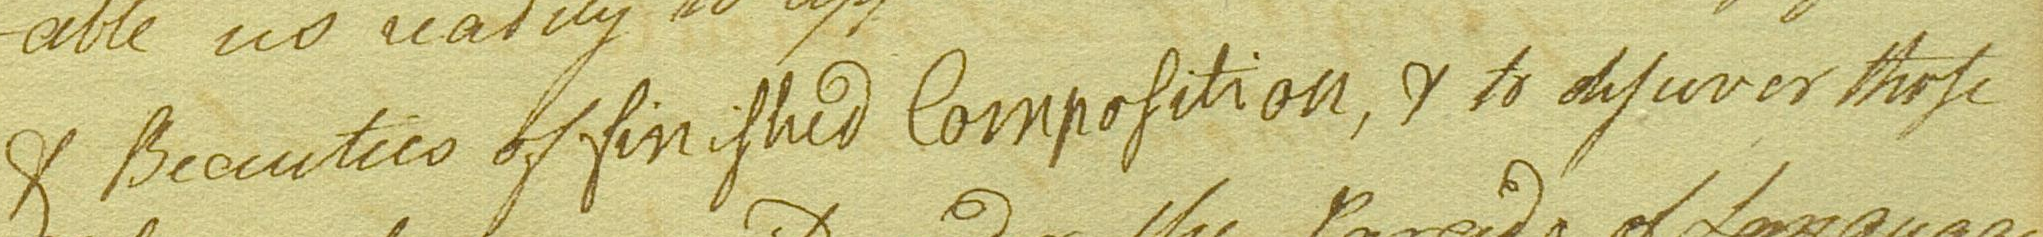& Beauties of finished Composition, & to discover those
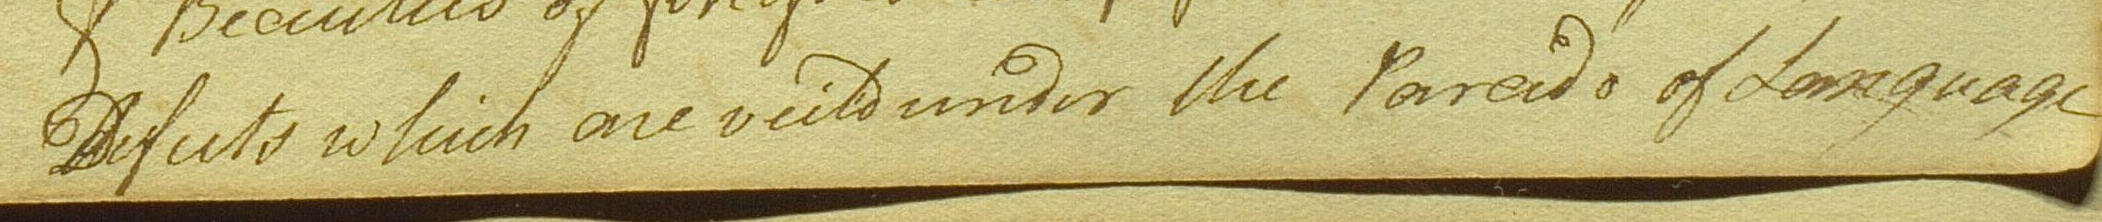Defects which are veil'd under the Parade of Language
